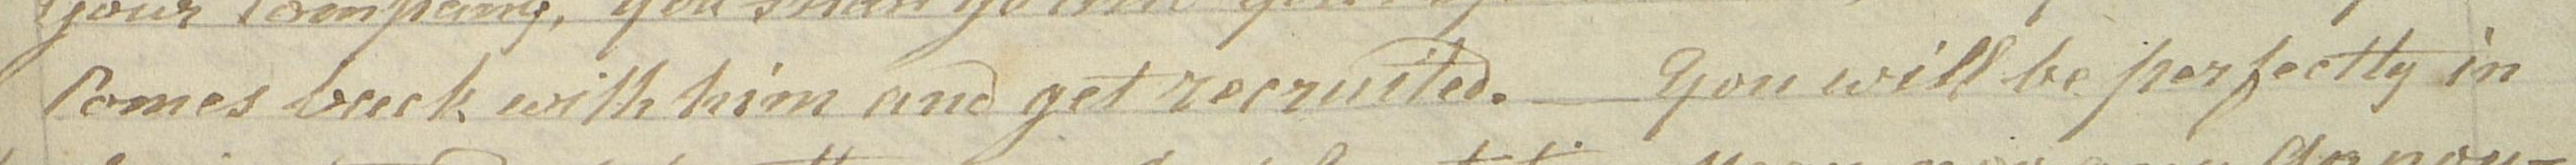Comes back with him and get recruited. You will be perfectly in
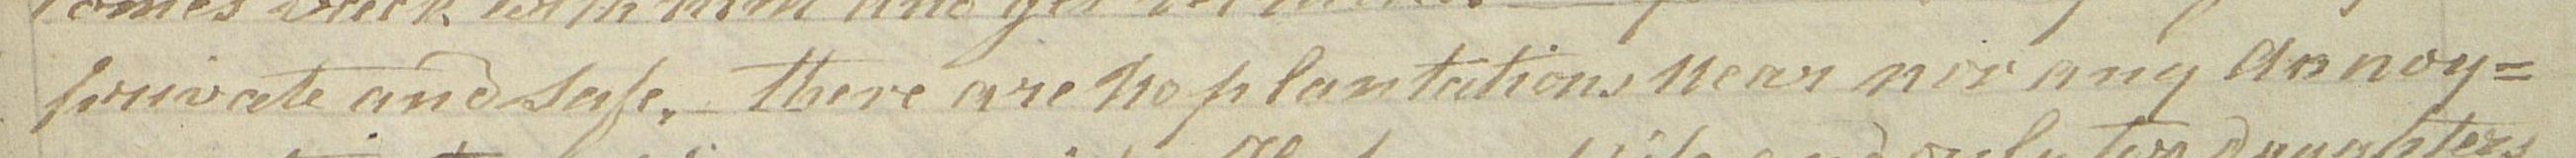private and safe, there are no plantations near now any Annoy-
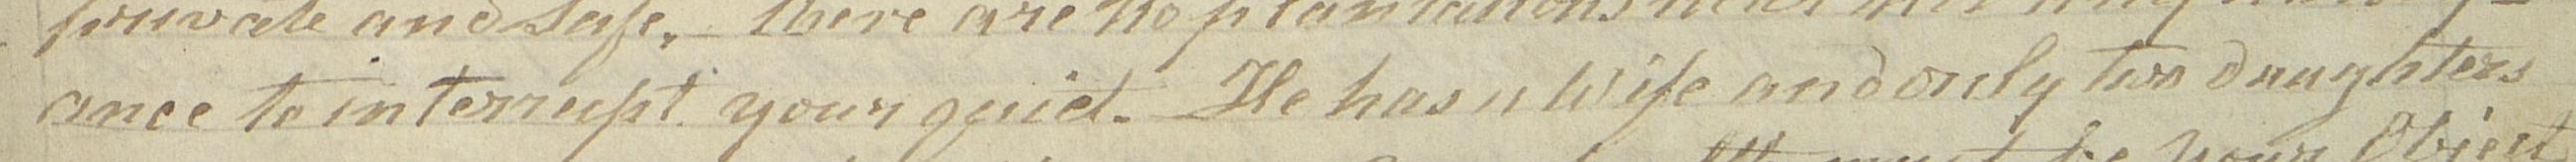once to interrupt your quiet. He has a Wife and only two daughters
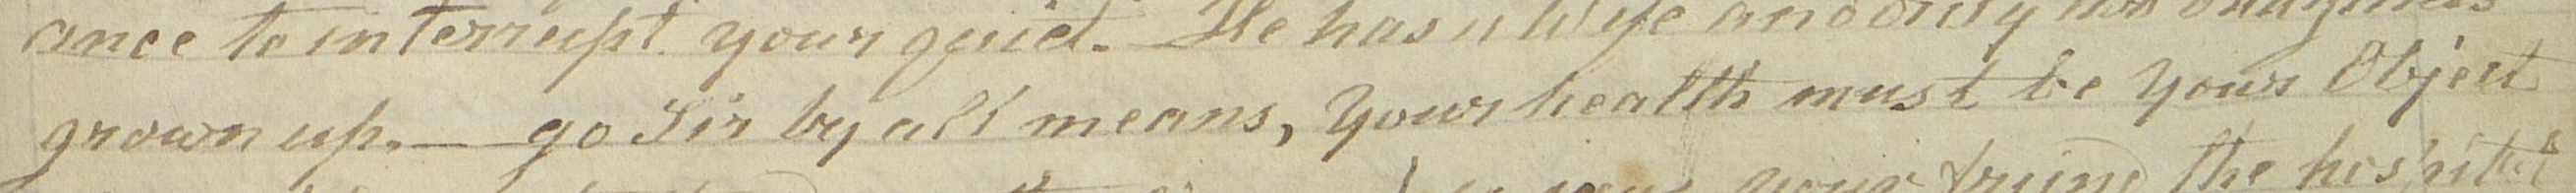grown up. go Sir by all means, your health must be your Object
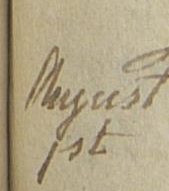August
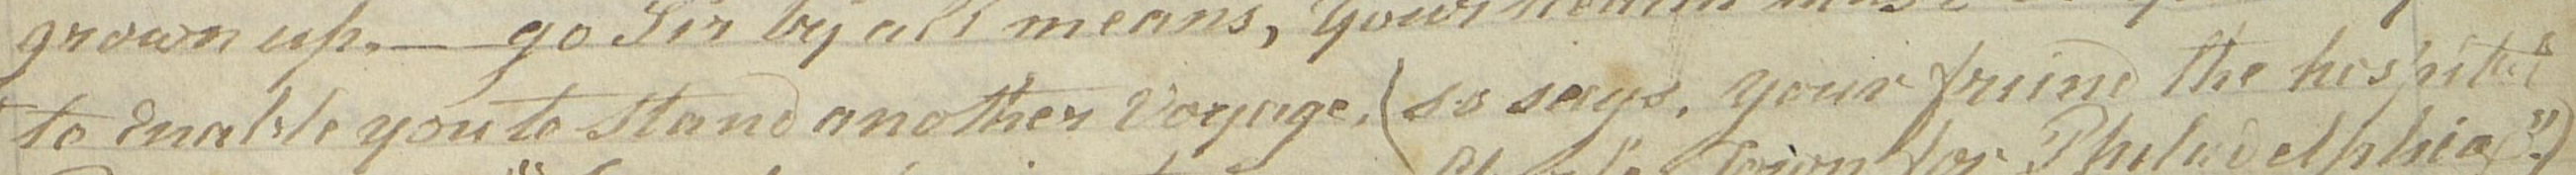To Enable you to stand another Voyage (so says, your friend the hospitable
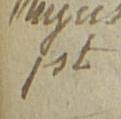I^st
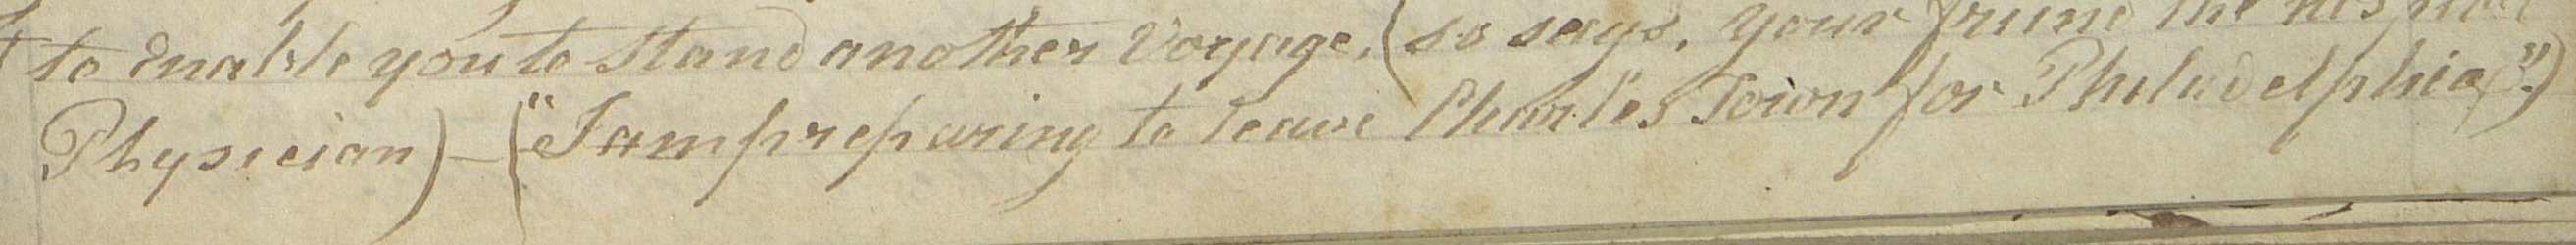Physician) ("I am preparing to leave Charles Town for Philadelphia".)
